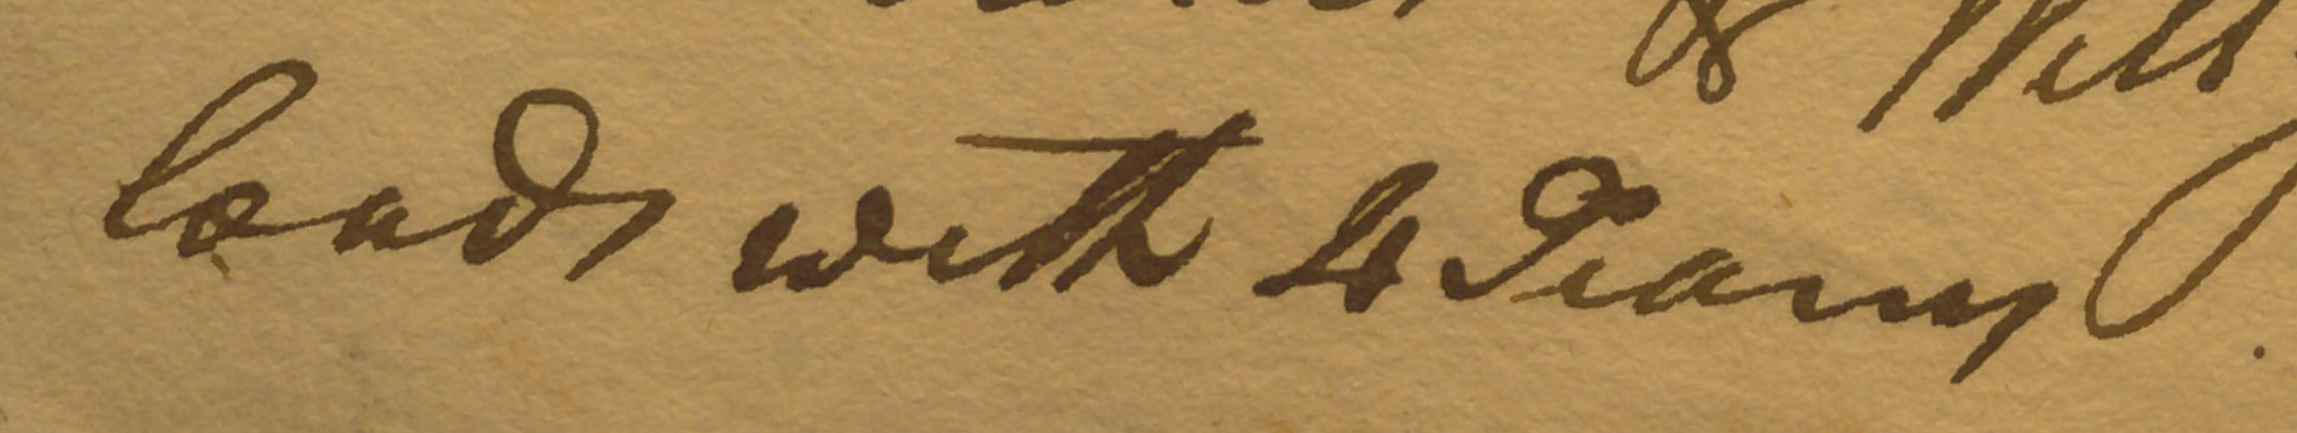loads with 4 Teams
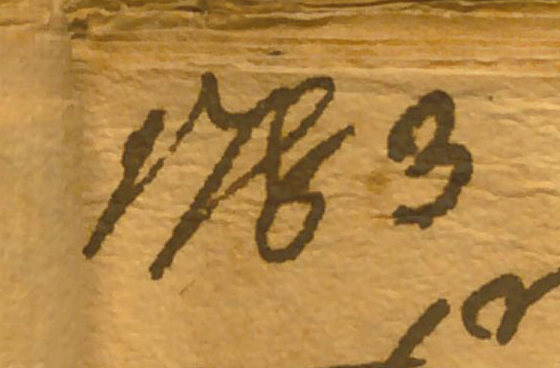1783
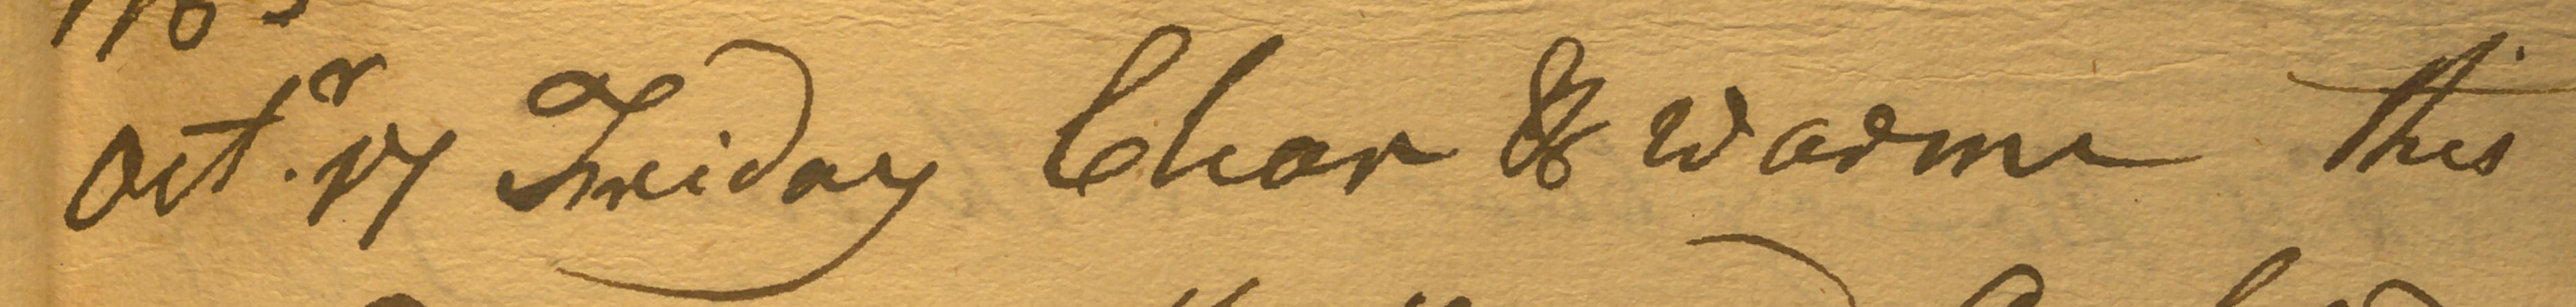Oct^r. 17 Friday Clear & Warme this
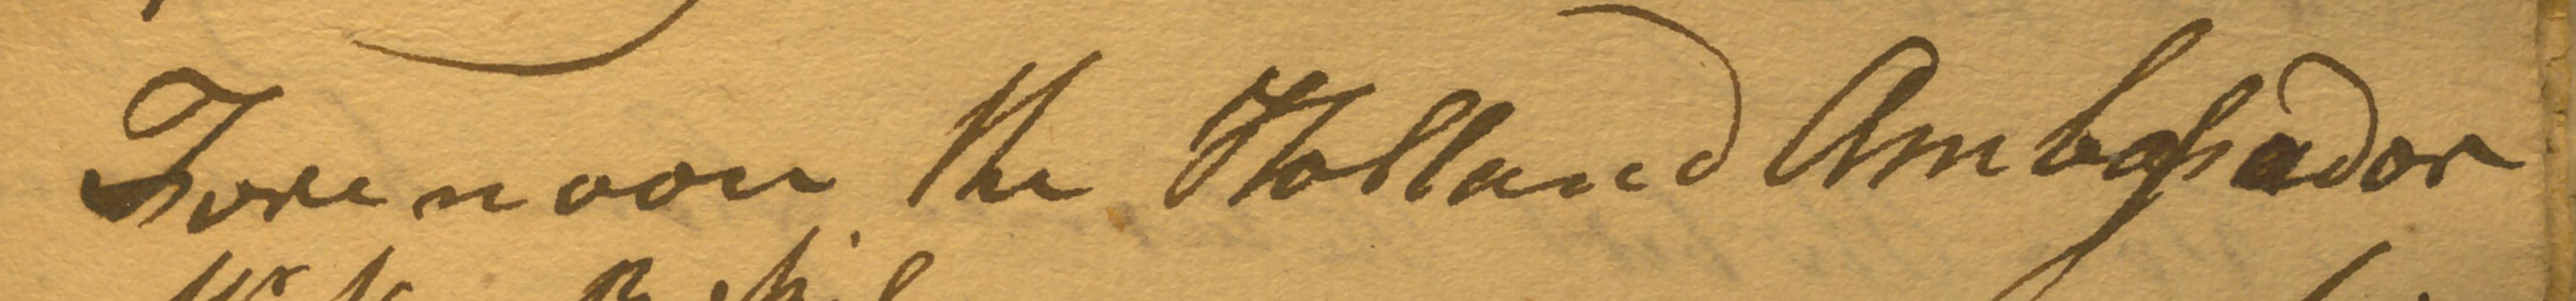Forenoon the Holland Ambassador
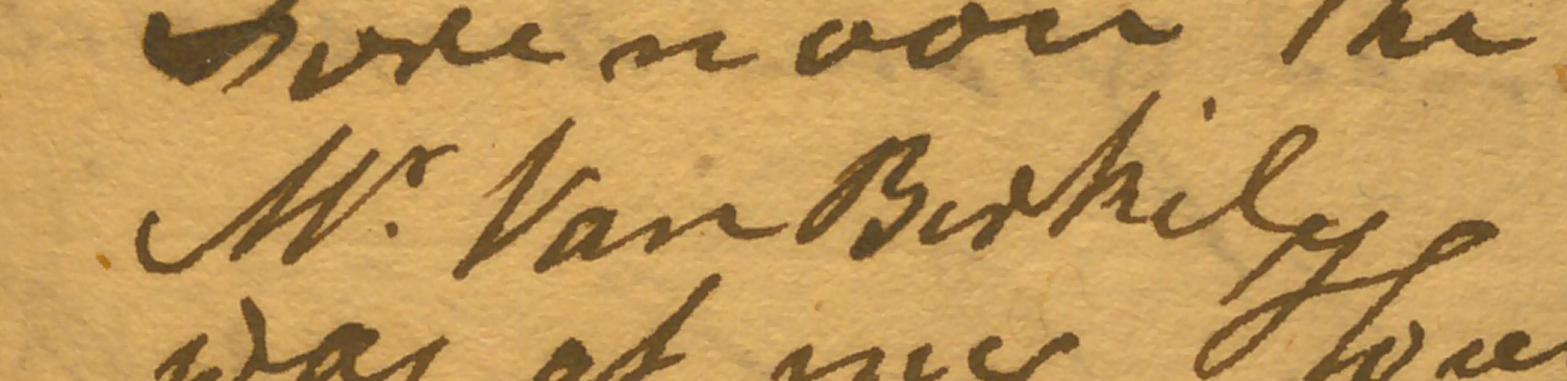M^r. Van Berkily
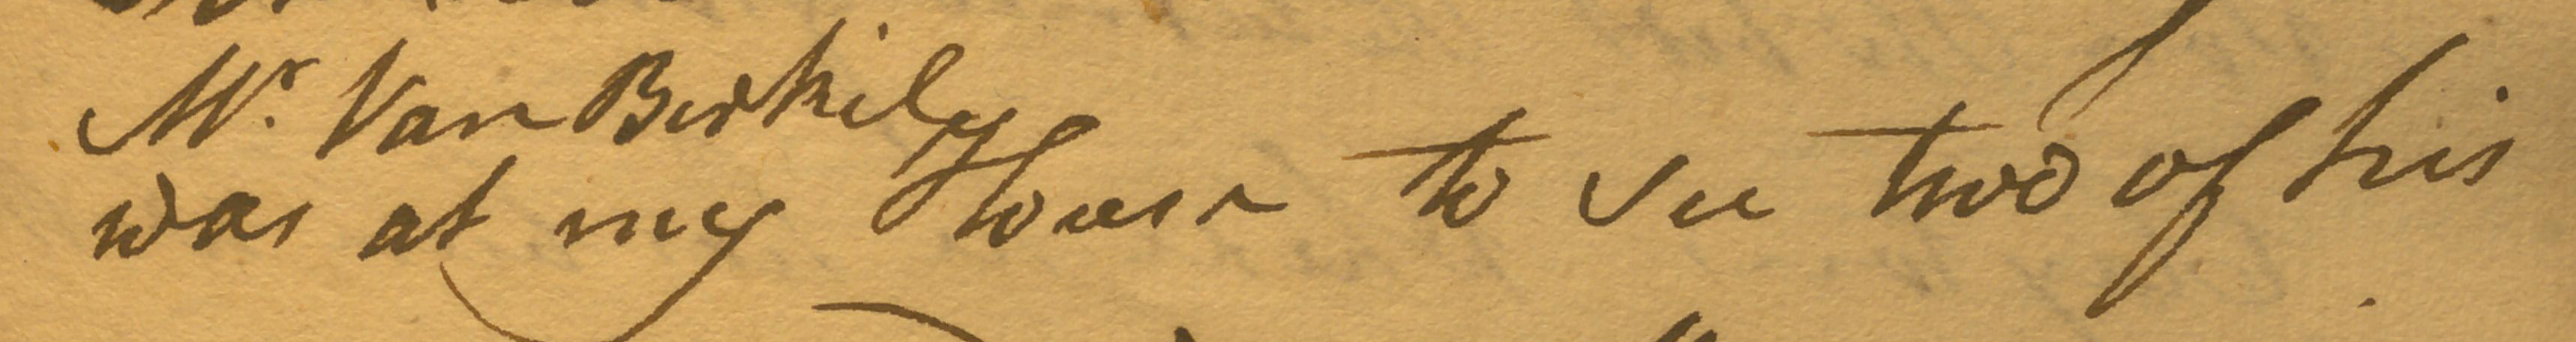was at my House to see two of his
